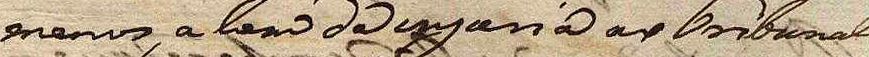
menos, alem da enjuria ao Tribunal
